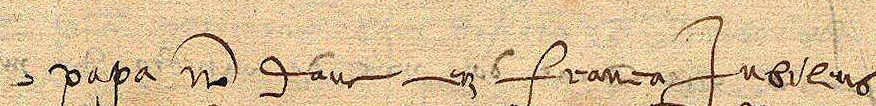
o papa nō daua em franca Jubileus
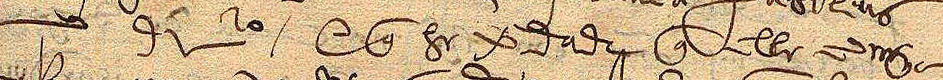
Po drro / e q̄ he ꝟdade q̄ elle comya
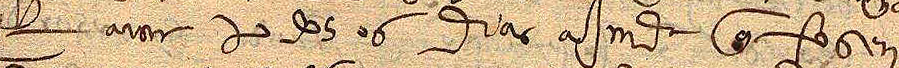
Carne todos os dias aJmda q̄ fosem
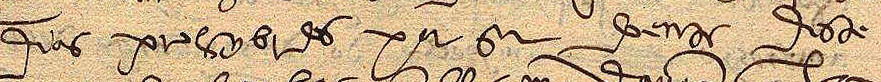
dias prohybidos por ser doente deste
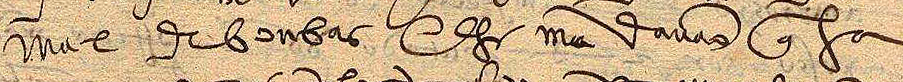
mal de boubas e lhe mādauão q̄ ha
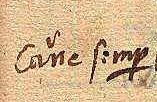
carne semꝑ
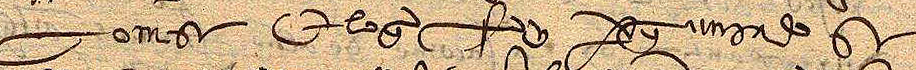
Comese E logo foy ꝑguntado se
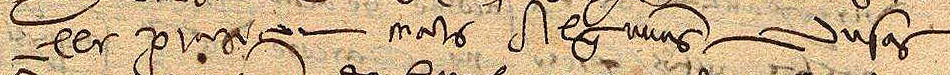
elle praticou majs Alguūas cousas
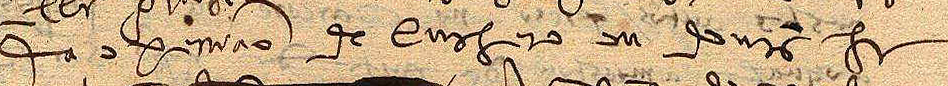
da openião de luthero ou doutos he
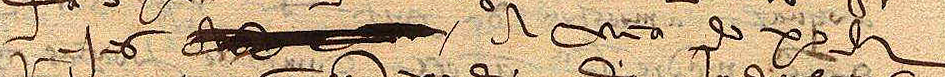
rejes _ / Acerca do poder
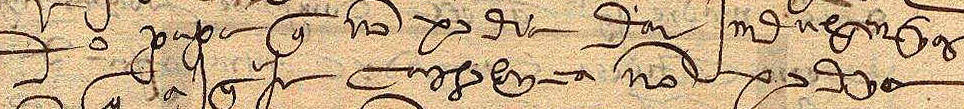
do papa q̄ nō podia dar Jmdulgencyas
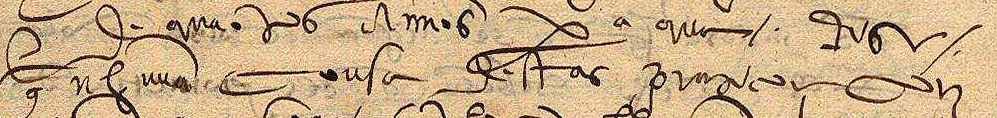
nehuuā Cousa destas pratecou con
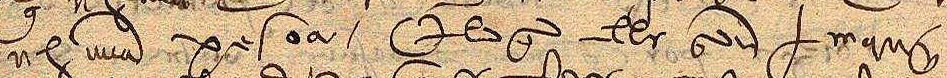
nehuuā pesoa / E logo elle sōr Jmquy
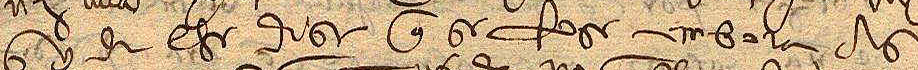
sydor lhe dise q̄ se fose embora A sua
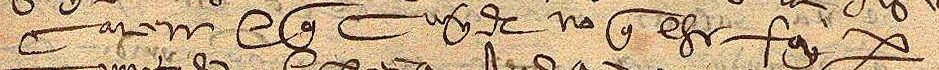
careira e q̄ cuyde no q̄ lhe foy ꝑ
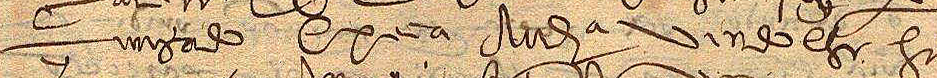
gumtado e hera Auda vendo lhe ho
